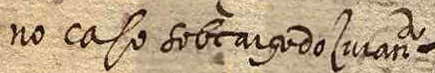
no caso sob cargo do Juramto
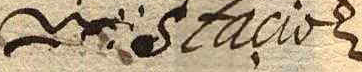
Stacio
